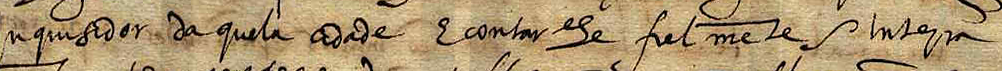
Jnquisidor daquela cidade E contar lhe fielmēte e Jntejra
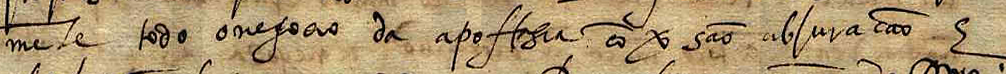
mēte todo o negocio da apostasia c̄oꝟsão abJuracão E
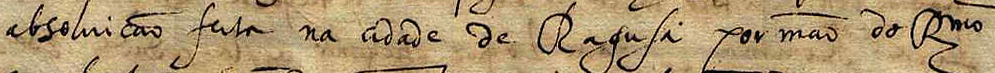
absoluicão feita na cidade de Ragusa por mão do Rmo
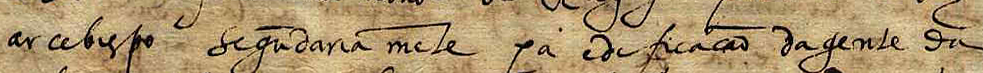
arcebispo segūdariamēte ꝑa edeficação da gente da
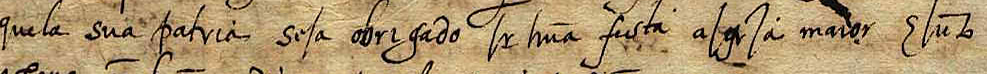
quela sua patria seja obrigado Jr hūa festa a JgrJa maior E Jūto
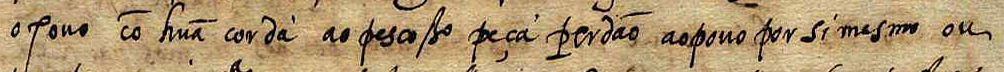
o pouo c̄o huā corda ao pescosso peça perdão ao pouo por si mesmo ou
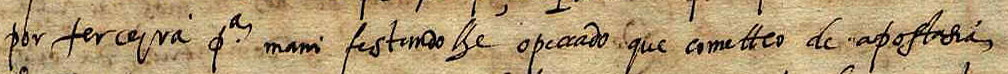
por tercejra pa. manifestando lhe o peccado que cometteo de apostasia,
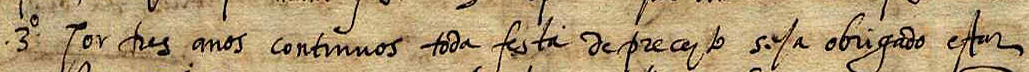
3o por tres anos continuos toda festa de precejto seja obrigado estar
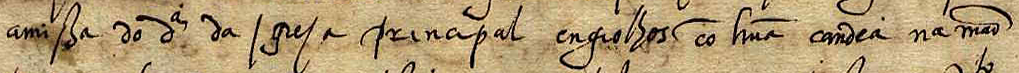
a missa do da da JgreJa principal en giolhos cō huā candea na maõ
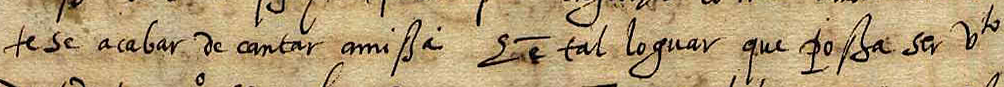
te se acabar de cantar a missa E ē tal loguar que possa ser vto
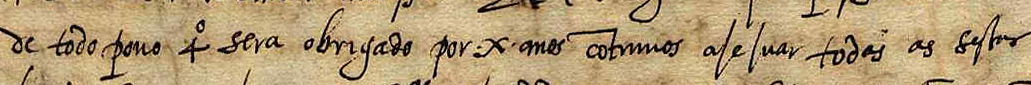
de todo pouo 4o sera obrigado por .x. anos cōtinuos a JeJuar todas as sestas
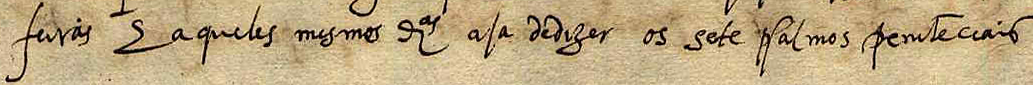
feiras E aqueles mesmos djas aJa de dizer os sete psalmos penitēciais
